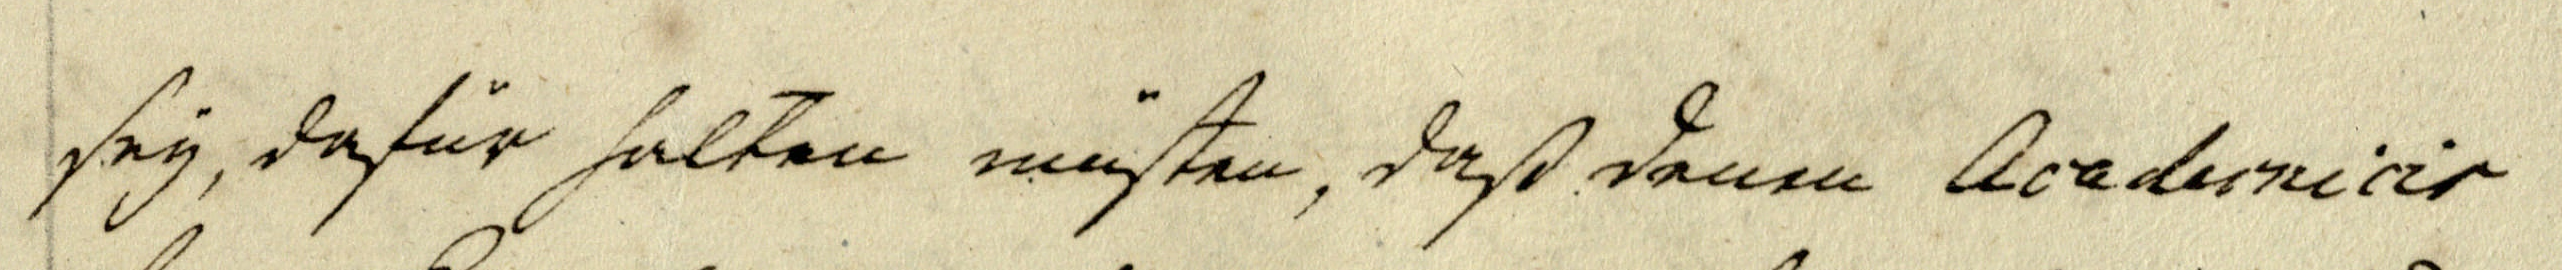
seÿ, dafür halten müßten, daß denen Academicis
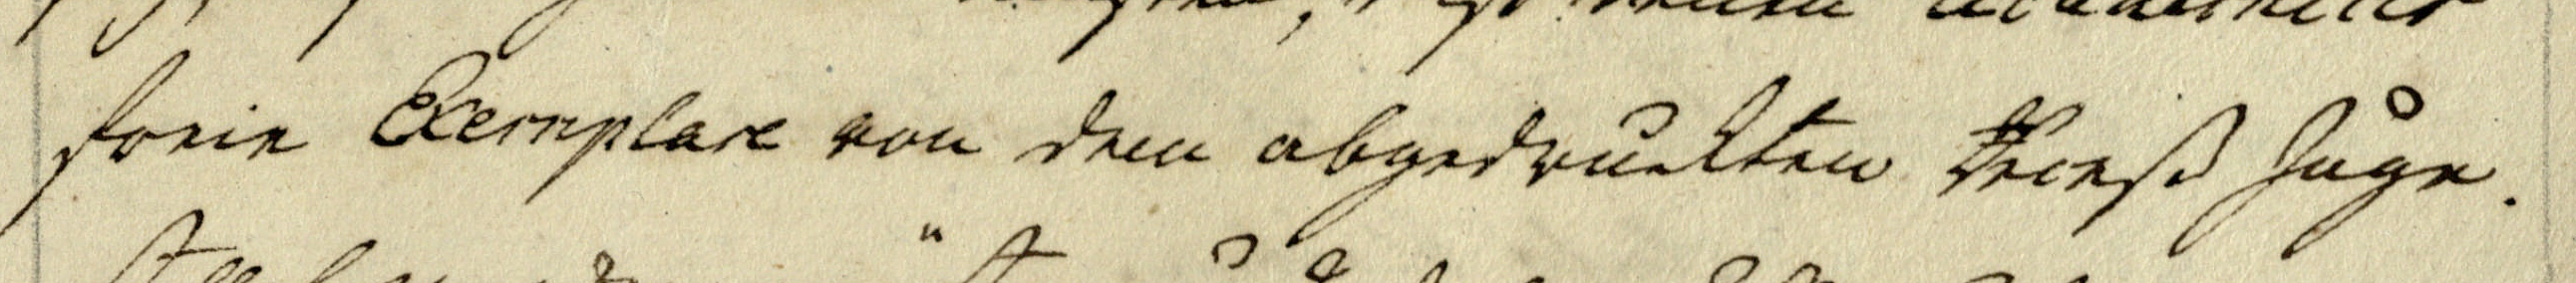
freie Exemplare von dem abgedruckten Receß zuge¬
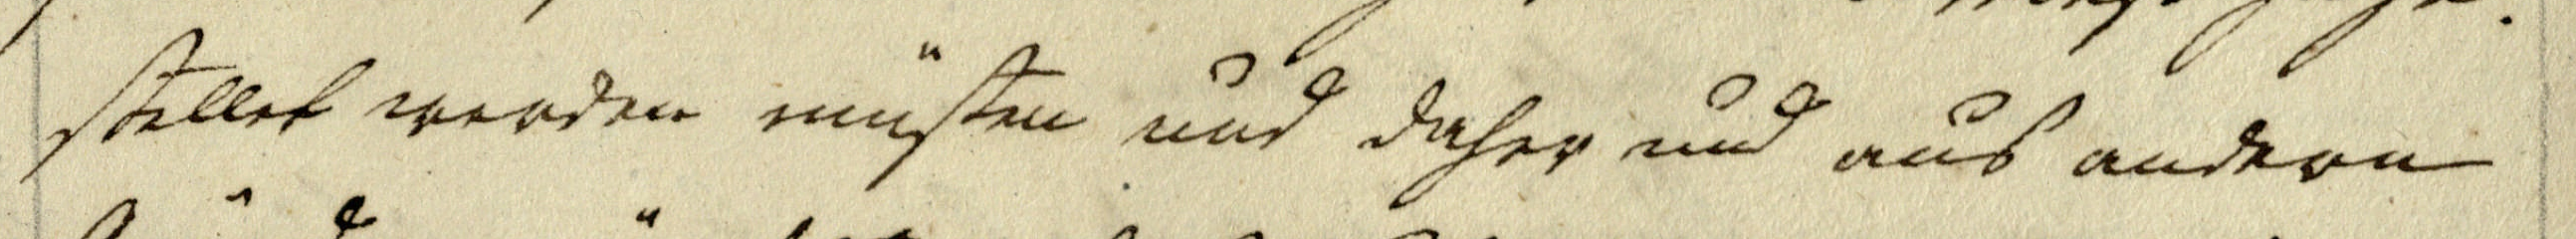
stellet werden müßten und daher und aus andern
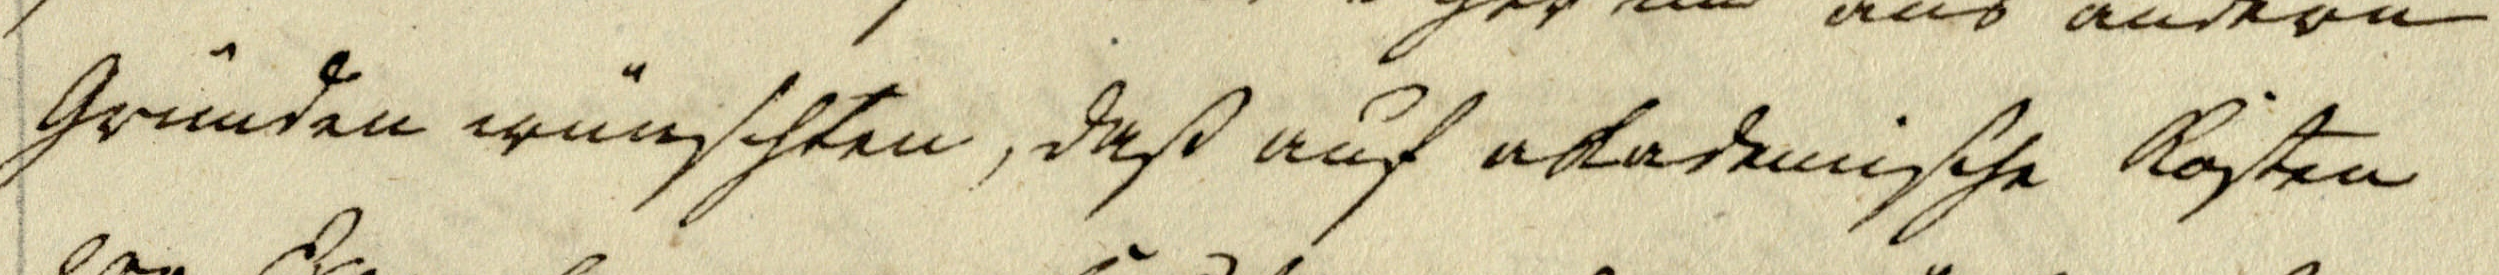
Gründen wünschten, daß auf akademische Kosten
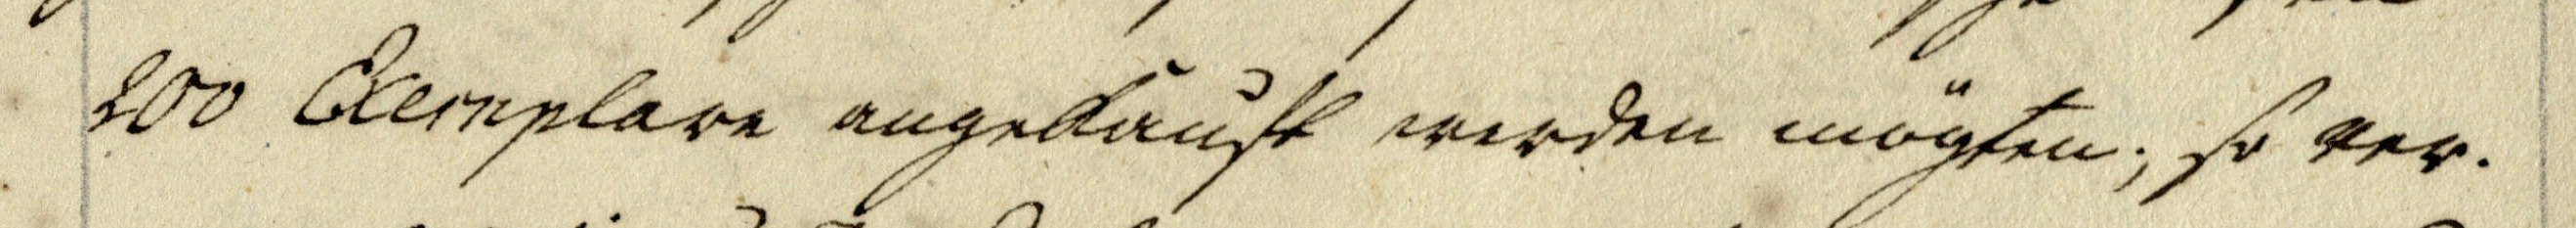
200 Exemplare angekauft werden mögten; so ver¬
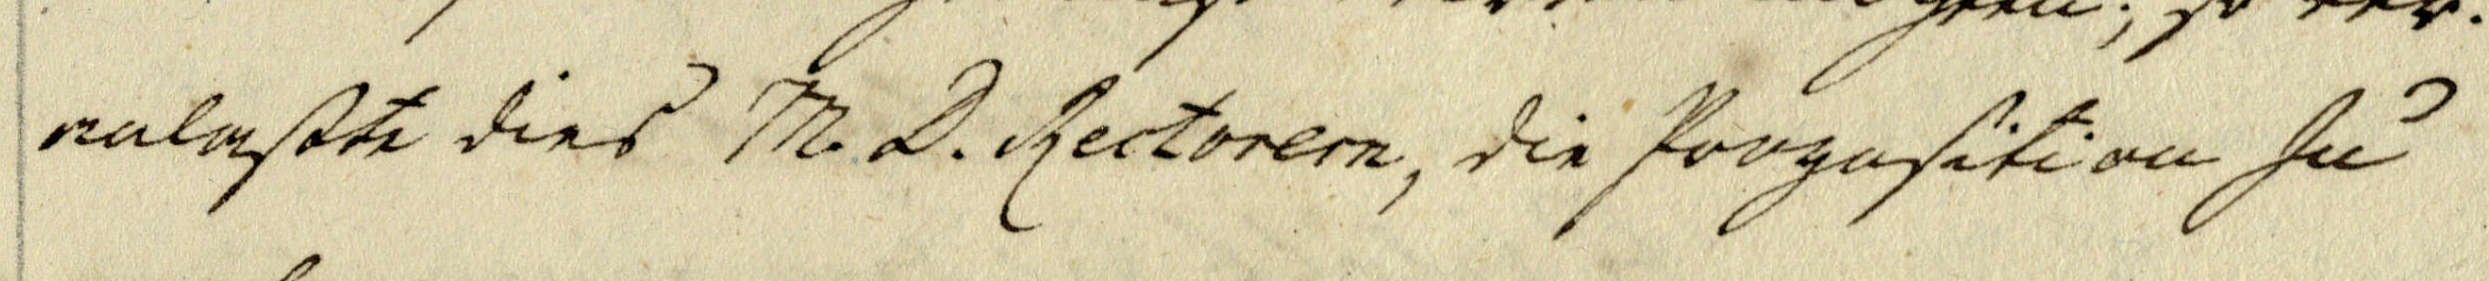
anlaßte dies M. D. Rectorem, die Proposition zu
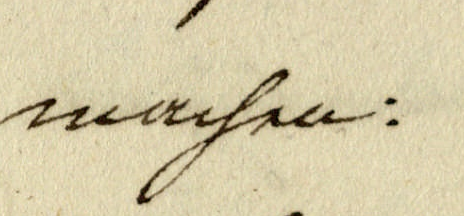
machen:
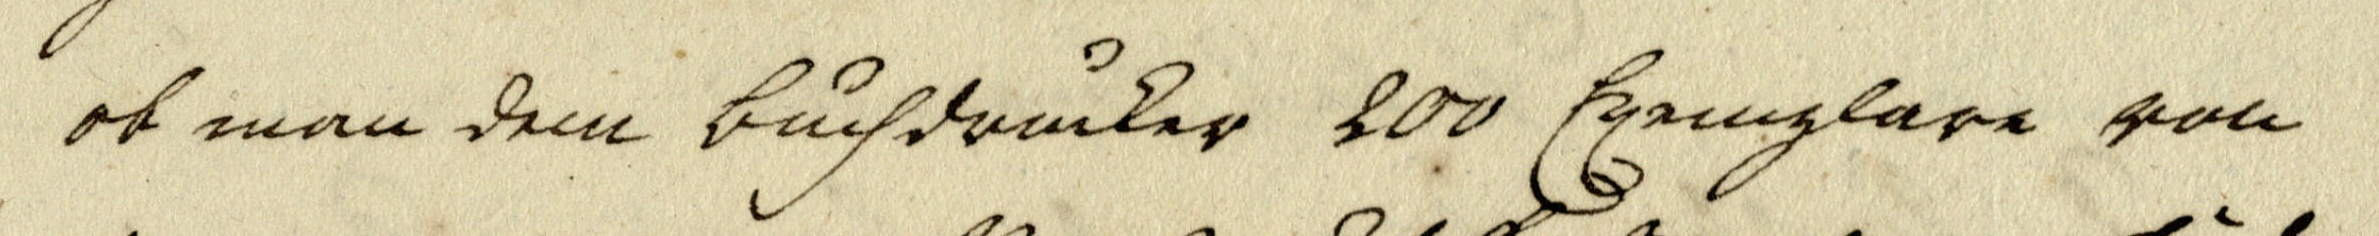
ob man dem Buchdrucker 200 Exemplare von
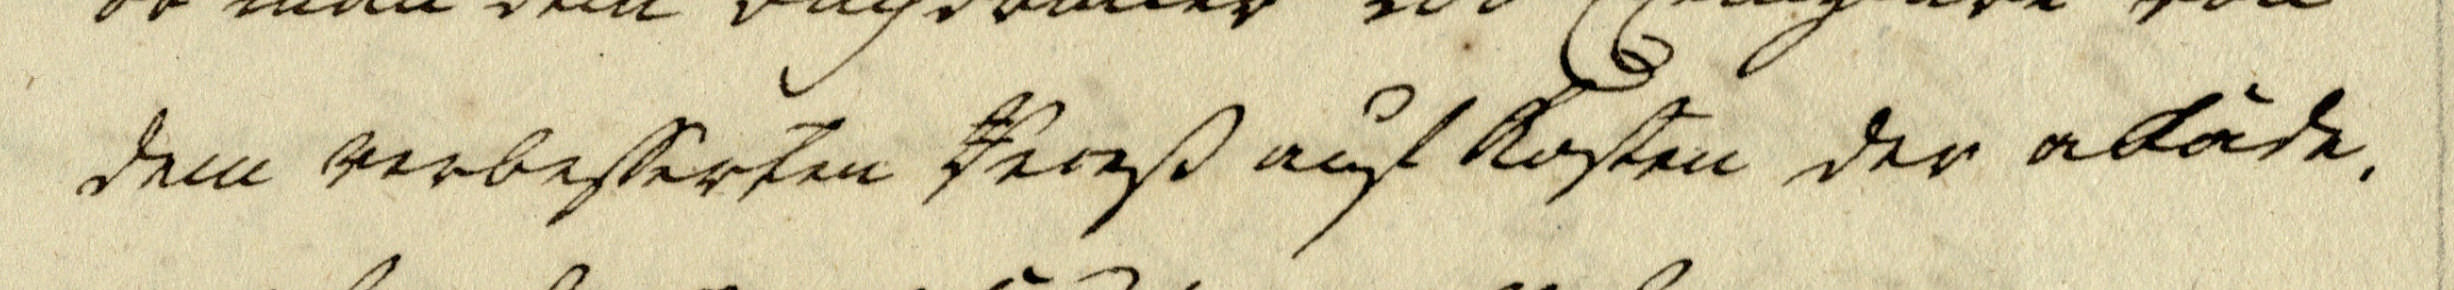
dem verbesserten Receß auf Kosten der akade¬
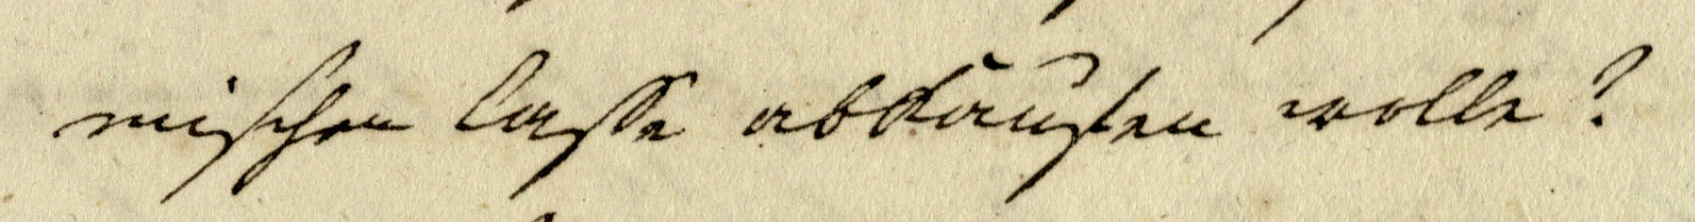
mischen Casse abkaufen wolle?
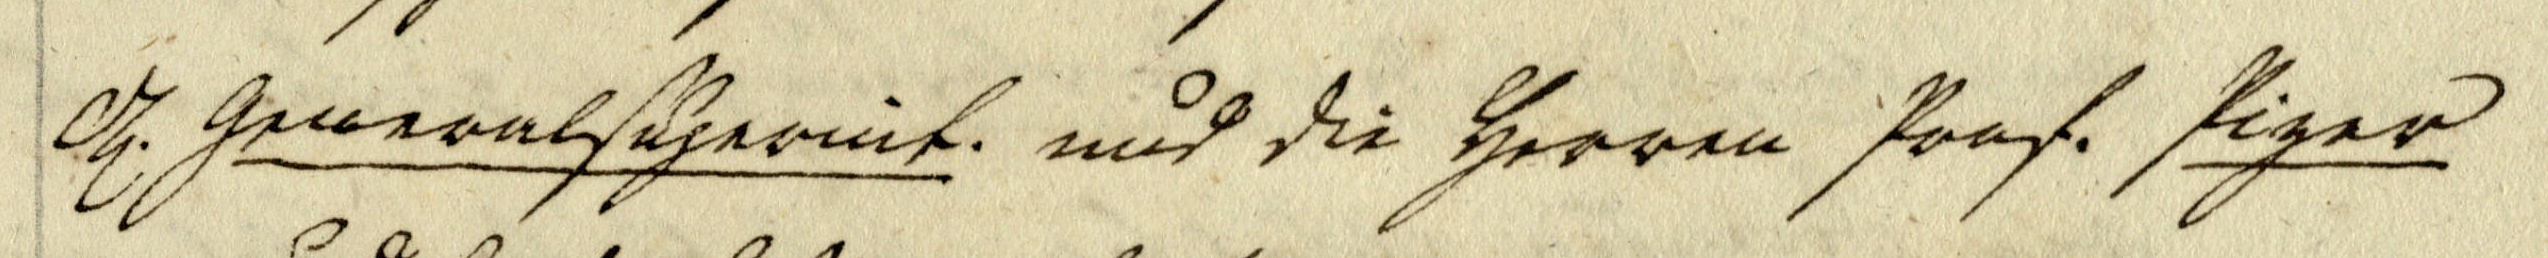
dh. Generalsuperint. und die Herren Prof. Piper
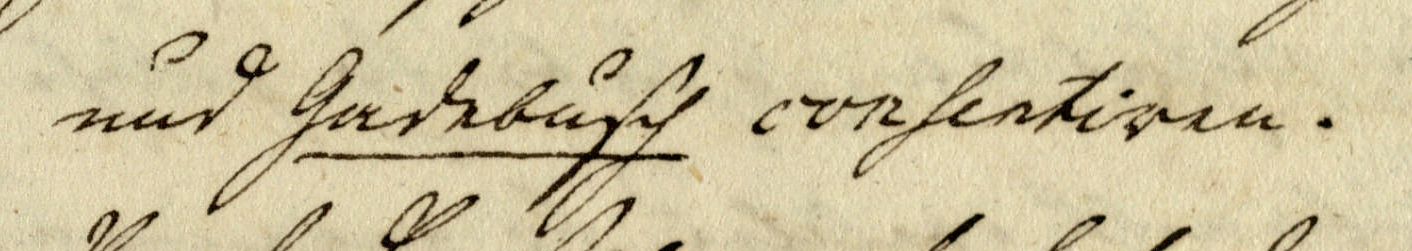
und Gadebusch consentiren.
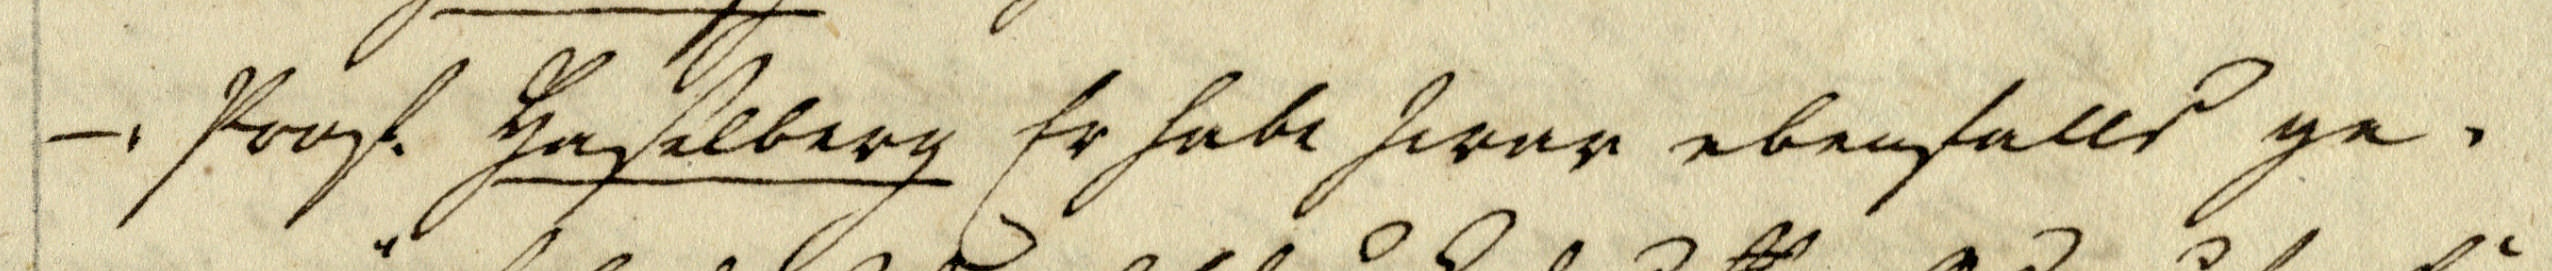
Prof. Haselberg Er habe zwar ebenfalls ge¬
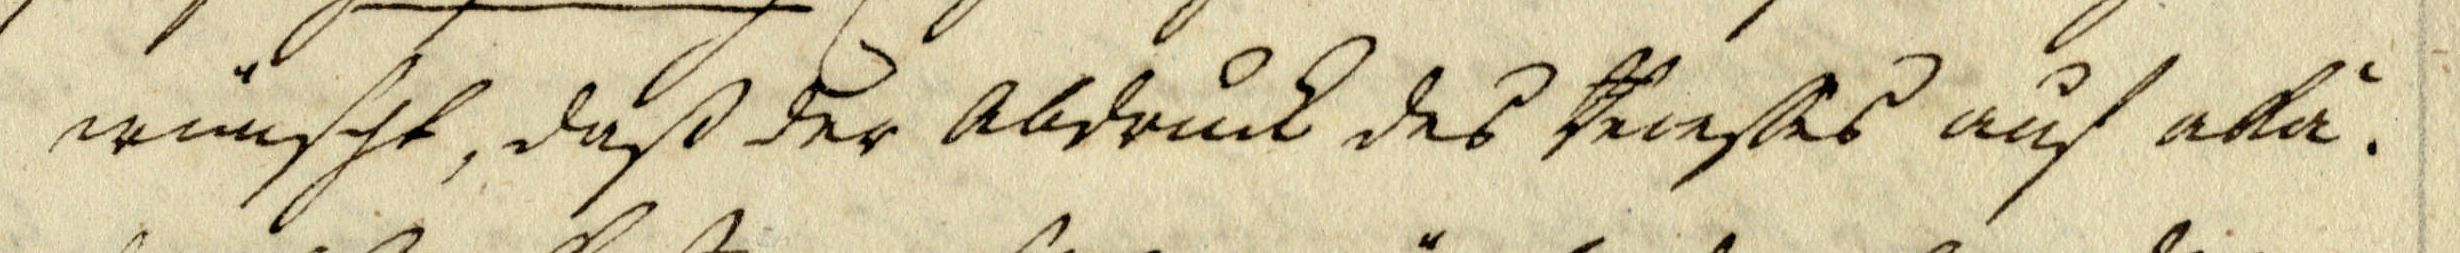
wünscht, daß der Abdruck des Recesses auf aka¬
